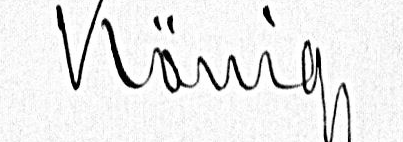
König
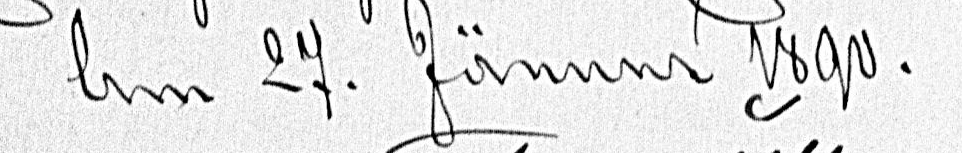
Am 27. Jänner 1890.
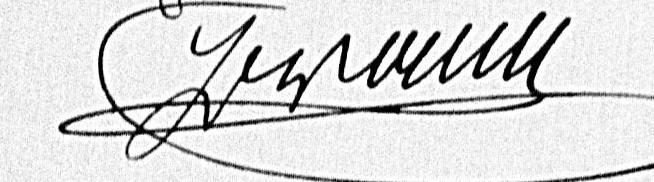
Braun
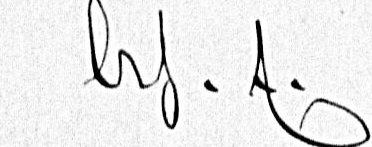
Ah.E.
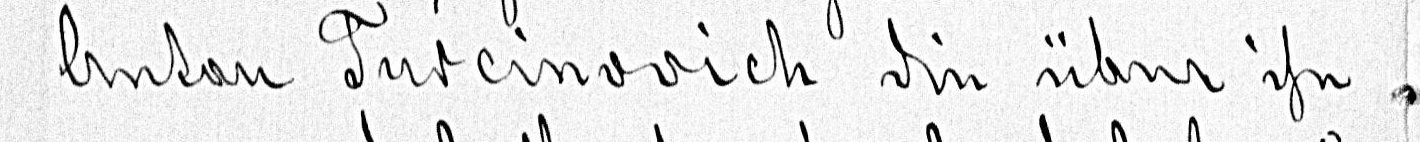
Anton Turcinovich die über ihn
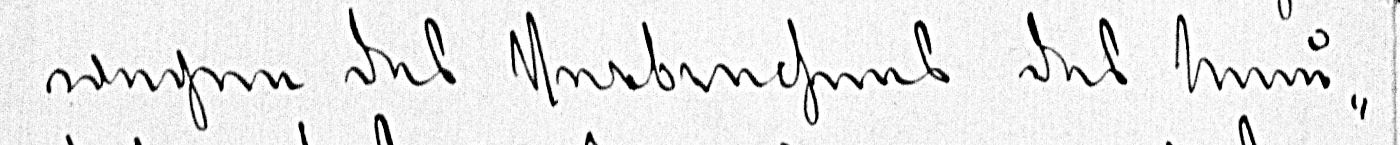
wegen des Verbrechens des Meu¬
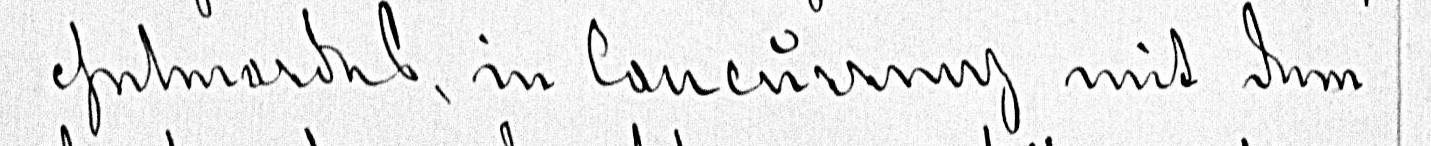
chelmordes, in Concurrenz mit dem
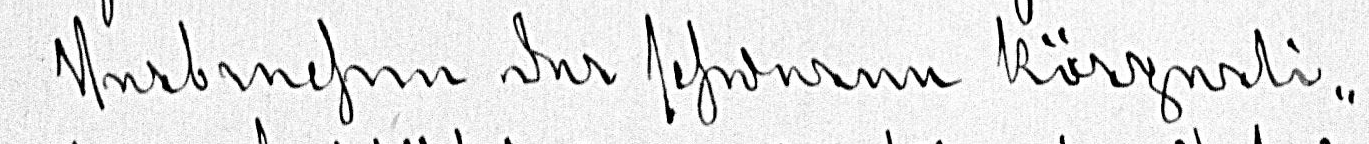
Verbrechen der schweren körperli¬
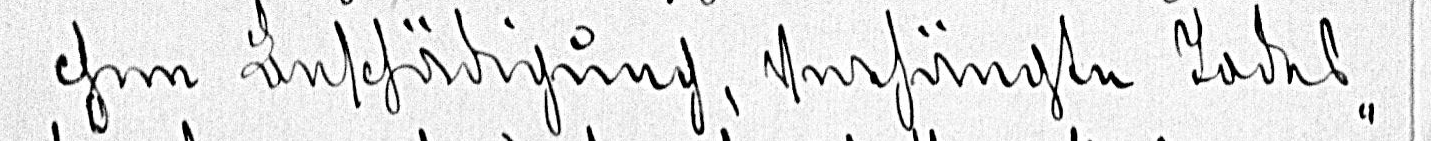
chen Beschädigung, verhängte Todes¬
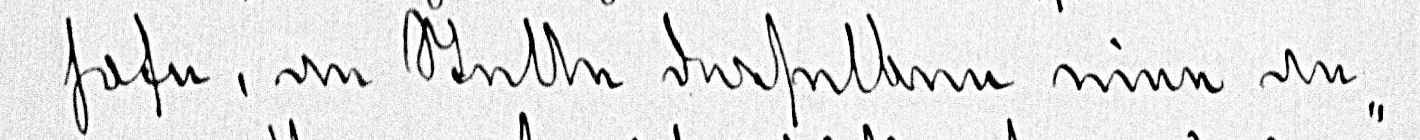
hofe, an Stelle derselben eine an¬
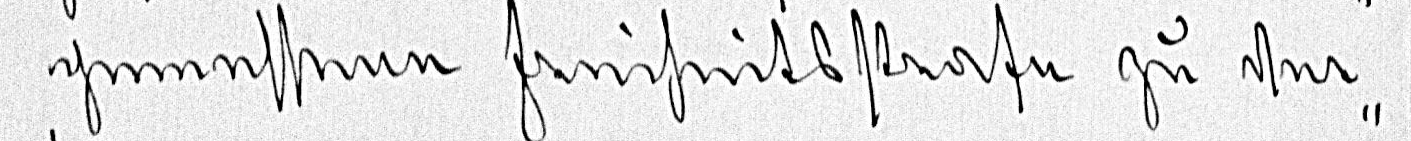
gemessene Freiheitsstrafe zu ver¬
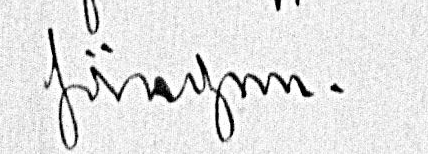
hängen.
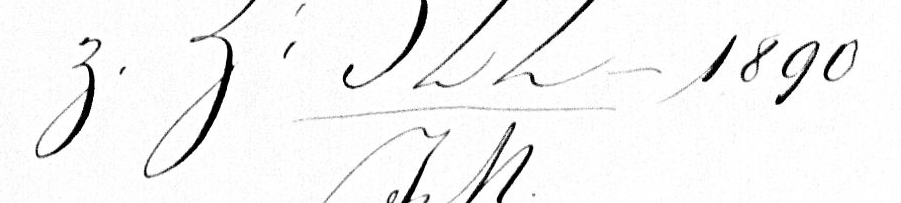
z.Z: 522 - 1890
